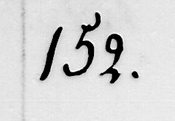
1839.
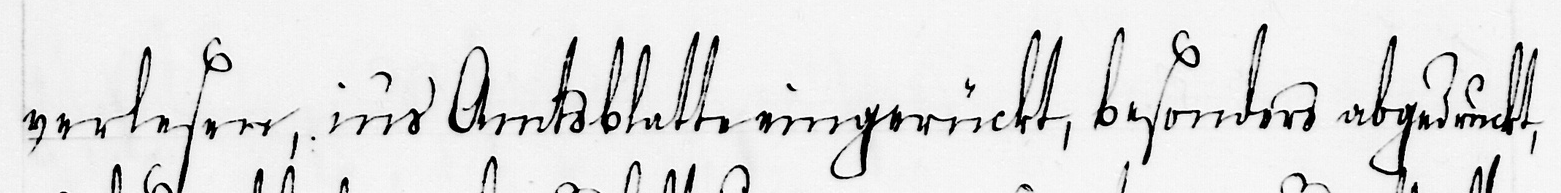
verlesen, in‘s Amtsblatte eingerückt, besonders abgedruck¬
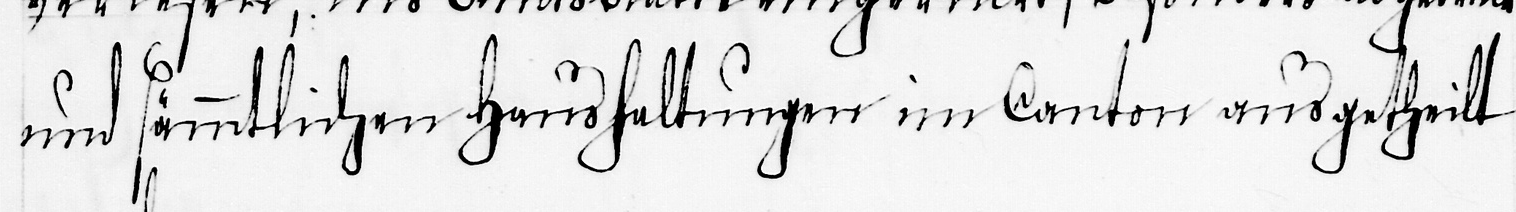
und sämmtlichen Haushaltungen im Canton ausgetheilt
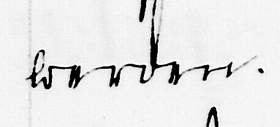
werden.
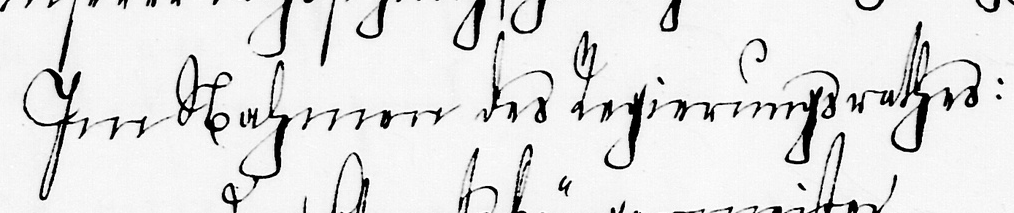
Im Nahmen des Regierungsrathes:
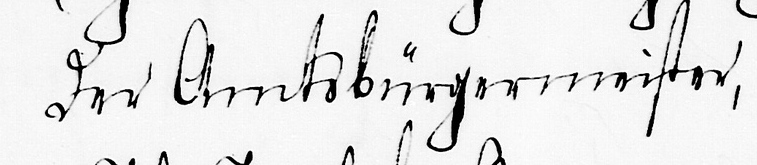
Der Amtsbürgermeister,
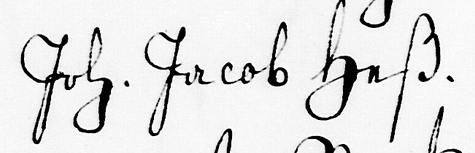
Joh. Jacob Heß.
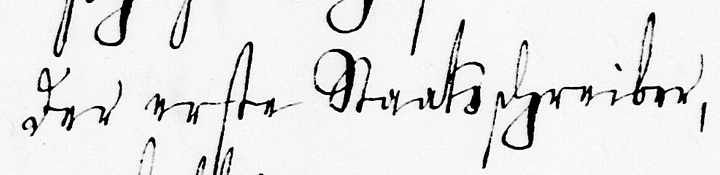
Der erste Staatsschreiber,
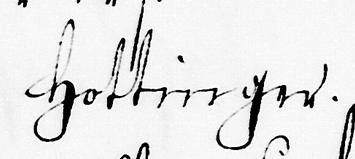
Hottinger.
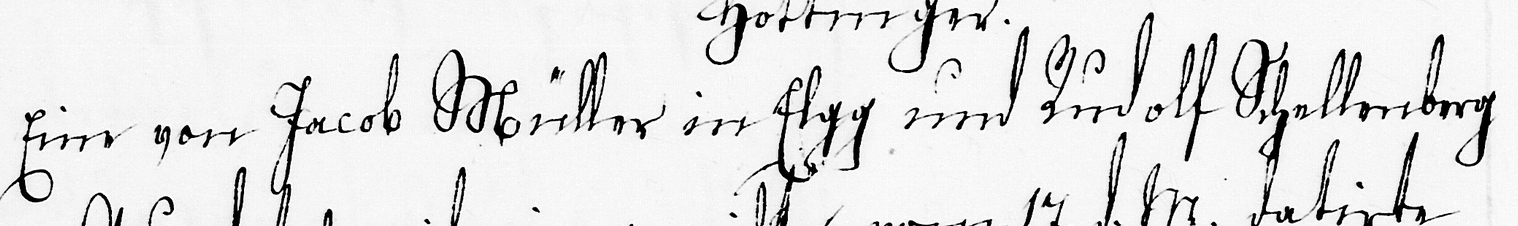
Eine von Jacob Müller in Elgg und Rudolf Schellenberg
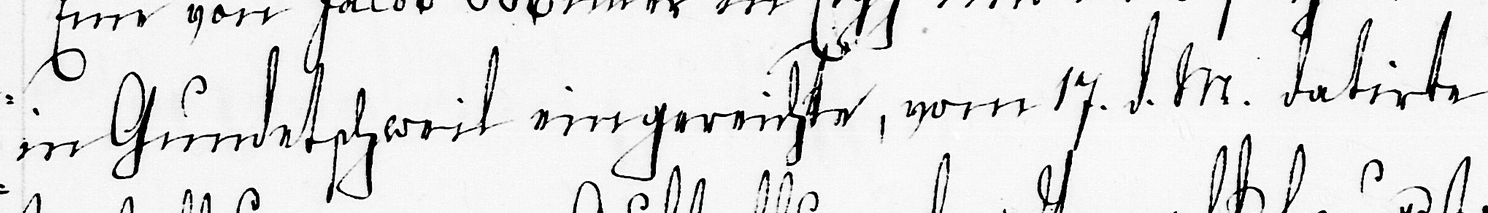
in Gundetschweil eingereichte, vom 17. d. M. datirte
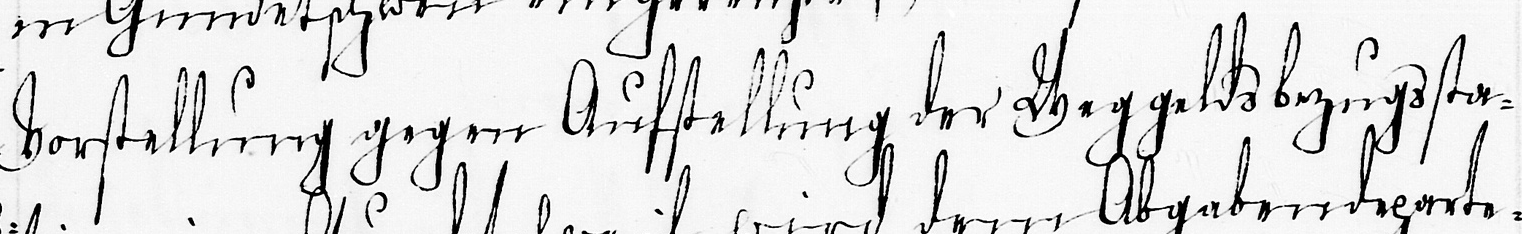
Vorstellung gegen Aufstellung der Weggeldsbezugsta¬
